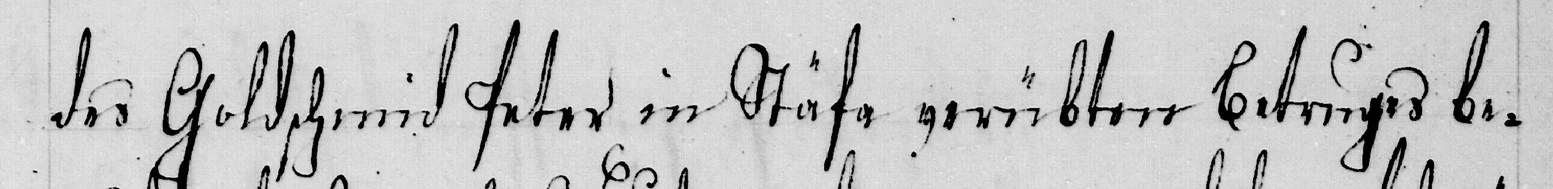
des Goldschmid Peter in Stäfa verübten Betruges be¬
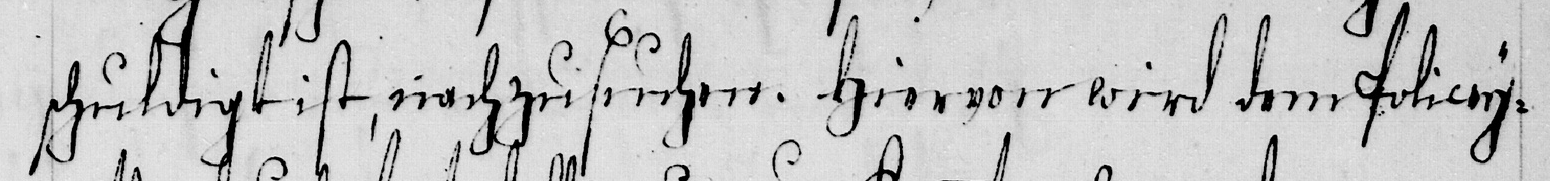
schuldigt ist, nachzusuchen. Hiervon wird dem Policey¬
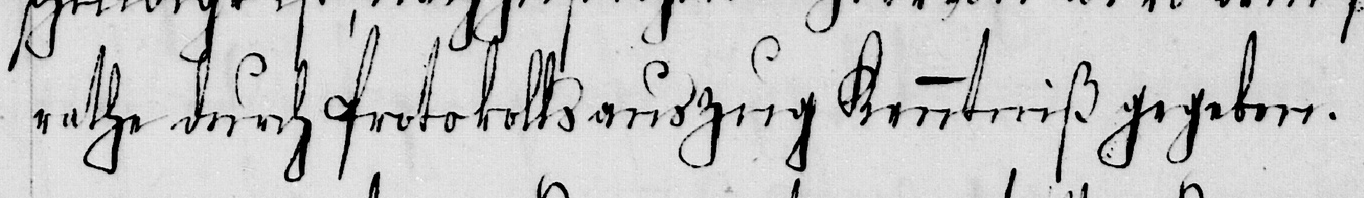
rathe durch Protokollsauszug Kenntniß gegeben.
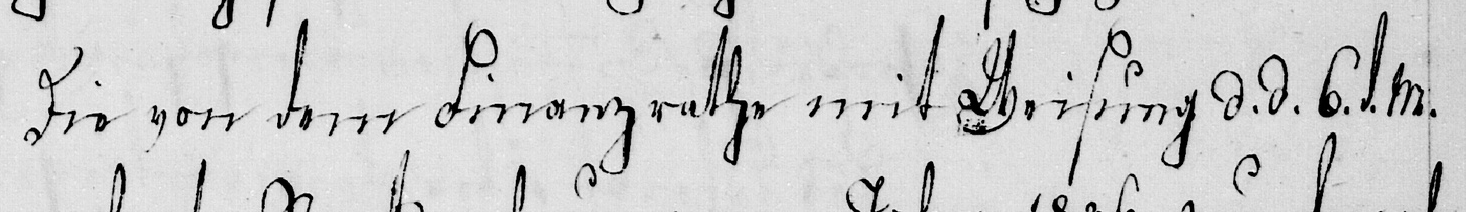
Die von dem Finanzrathe mit Weisung d. d. 6.
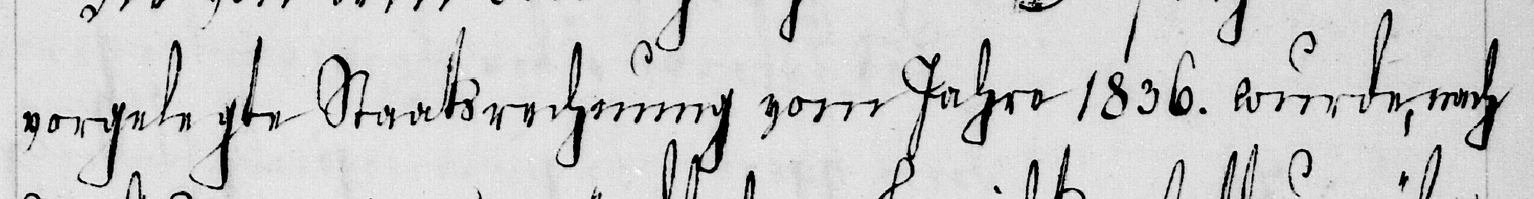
vorgelegte Staatsrechnung vom Jahre 1836. wurde, nach
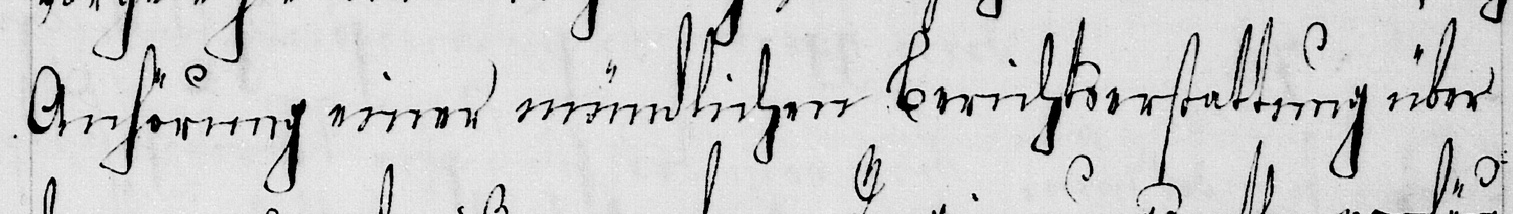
Anhörung einer mündlichen Berichterstattung über
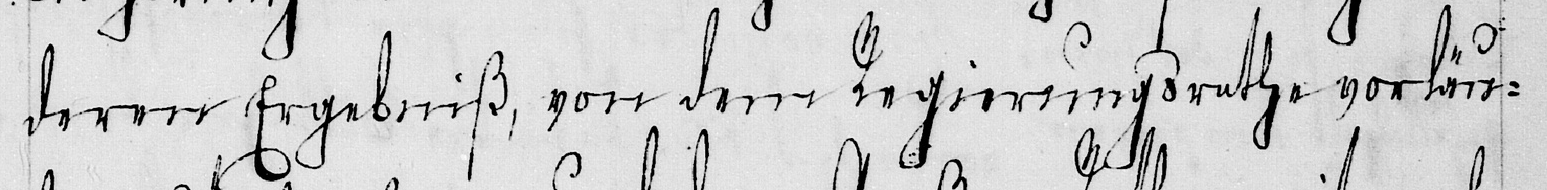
deren Ergebniß, von dem Regierungsrathe vorläu¬
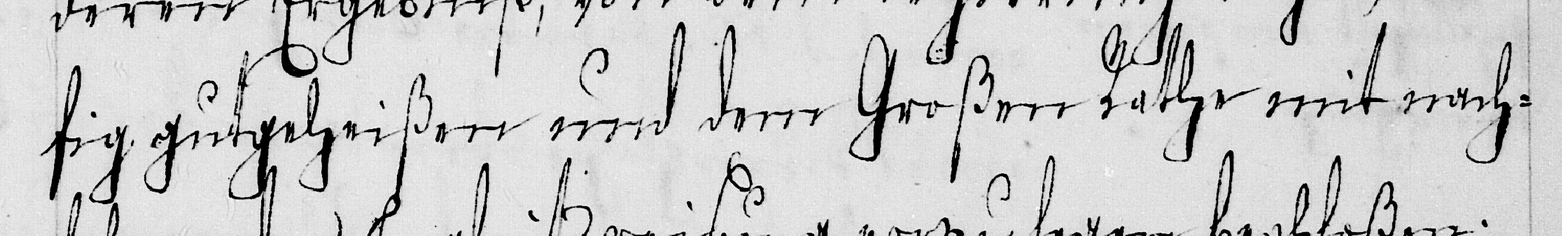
fig gutgeheißen und dem Großen Rathe mit nach¬
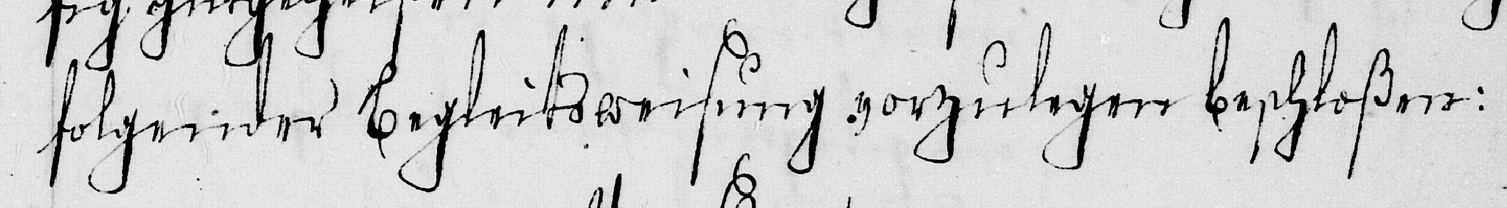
folgender Begleitsweisung vorzulegen beschloßen:
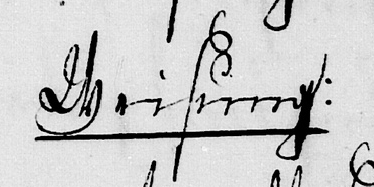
Weisung:
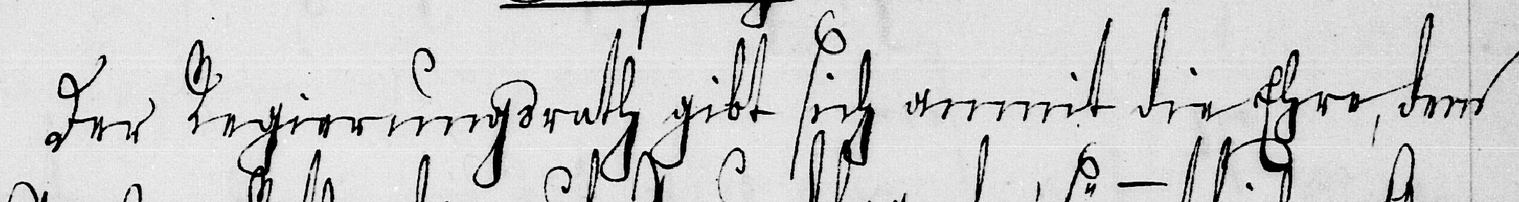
Der Regierungsrath gibt sich anmit die Ehre, dem
